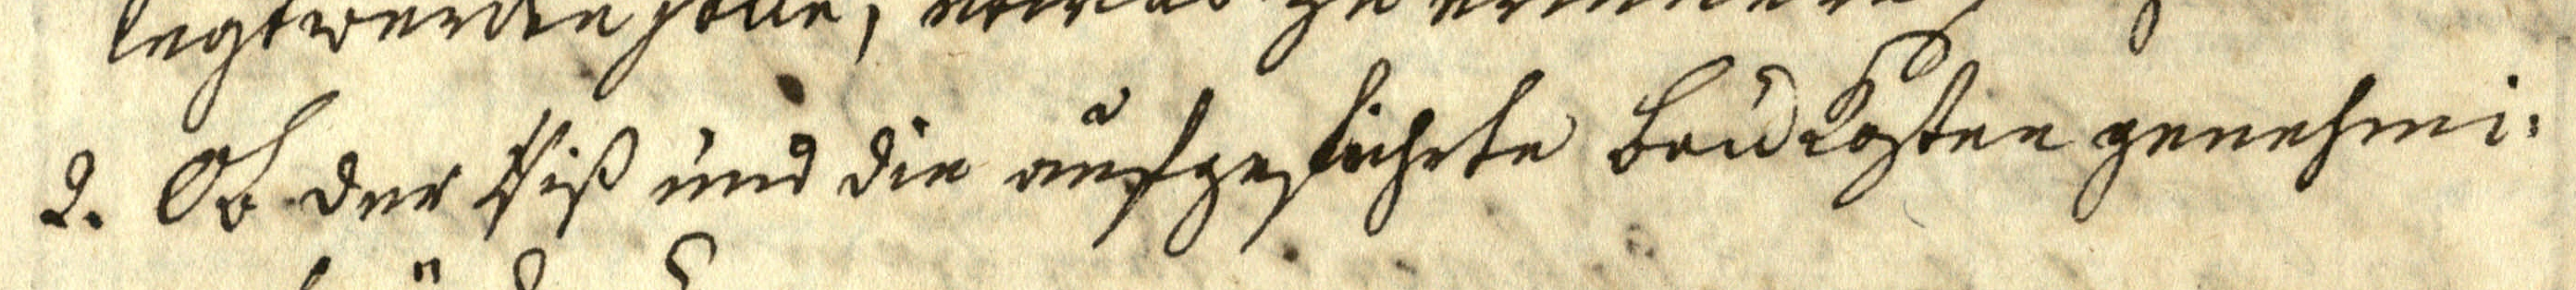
2. Ob der Riß und die aufgeführte bei BauKosten genehmi¬
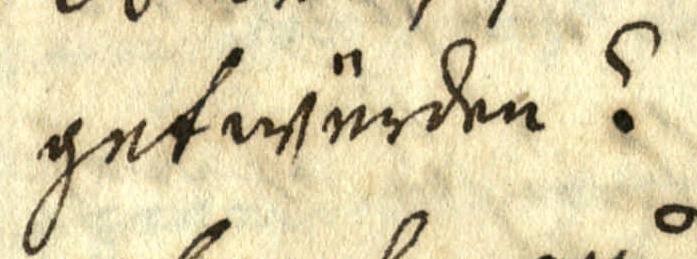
get würden?
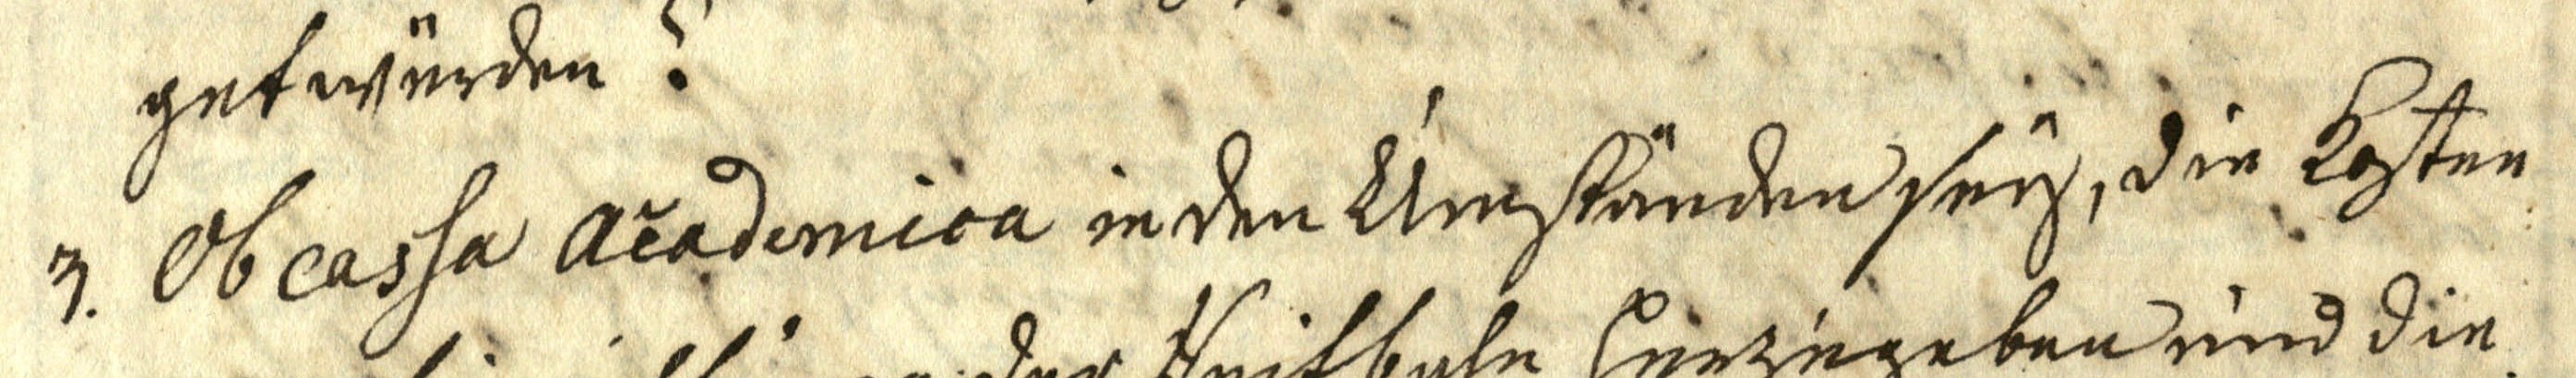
3. Ob cassa Academica in den Umständen seÿ, die Kosten
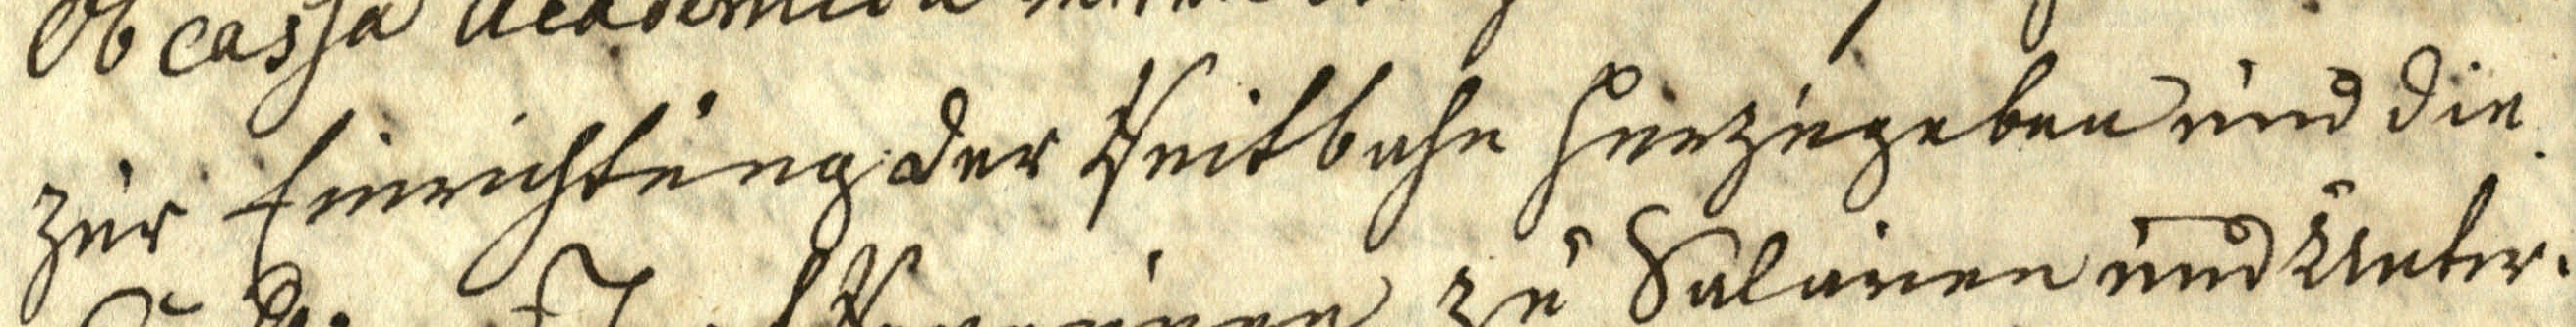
zur Einrichtung der Reitbahn herzugeben und die
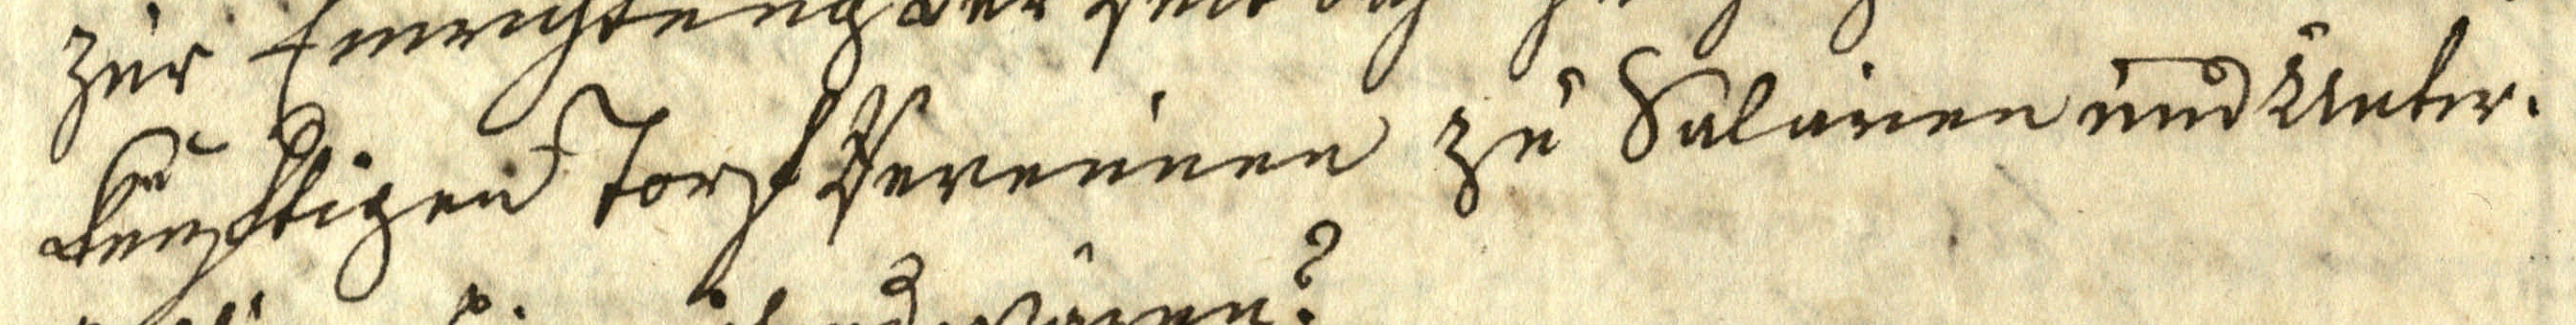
künftigen Torf Revenuen zu Salarien und Unter¬
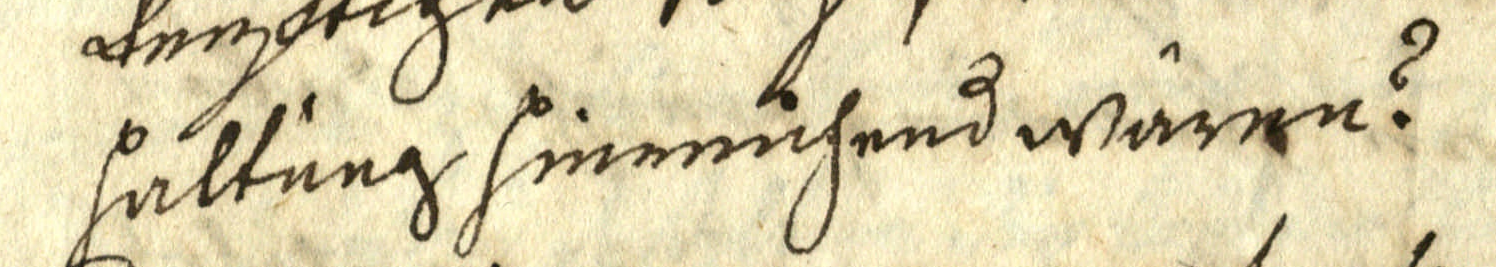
haltung hinreichend wären?
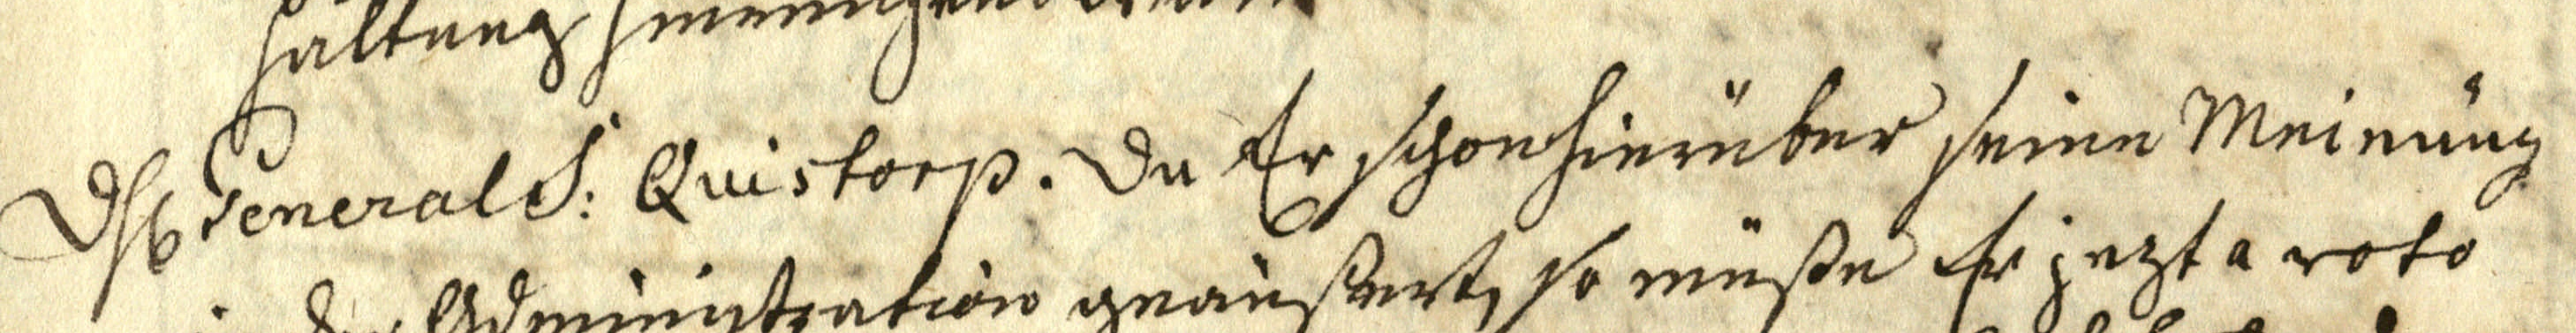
dh GeneralS. Quistorp. Da Er schon hierüber seine Meinung
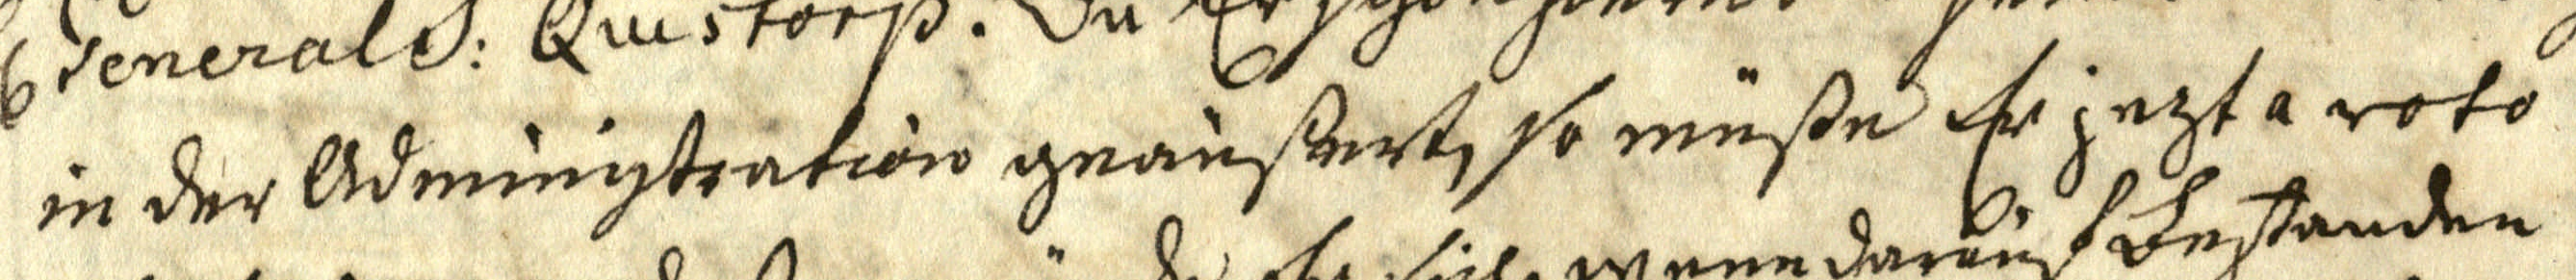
in der Administration äußert, so müße Er jezt a voto
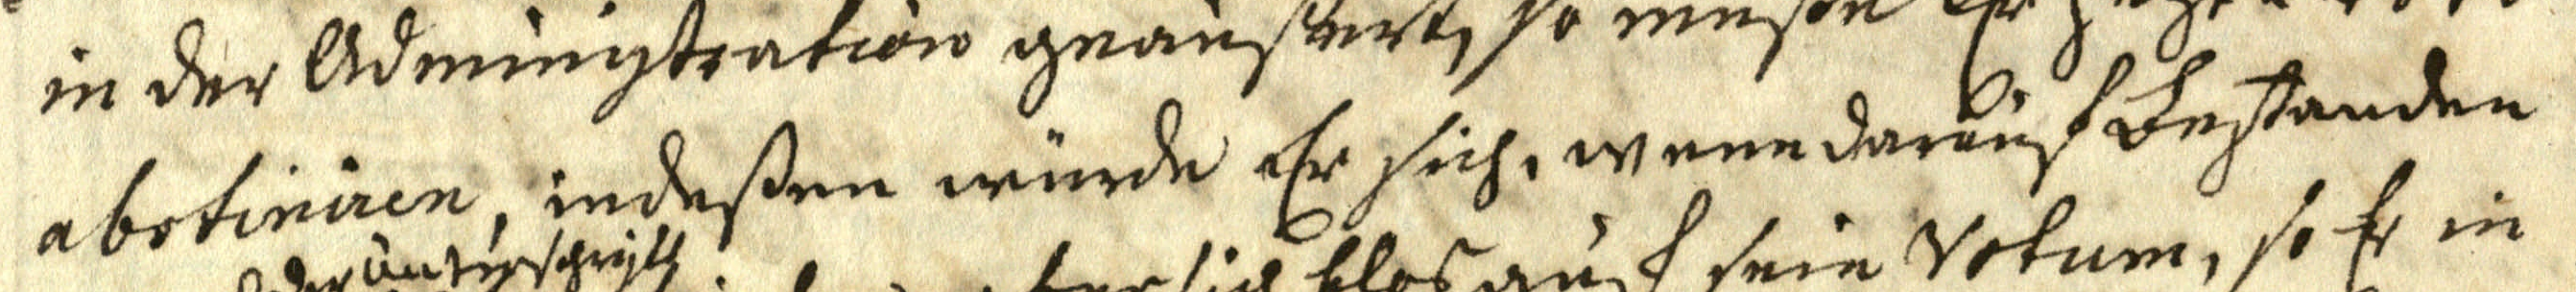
abstiniren, indeßen würde Er sich, wenn darauf bestanden
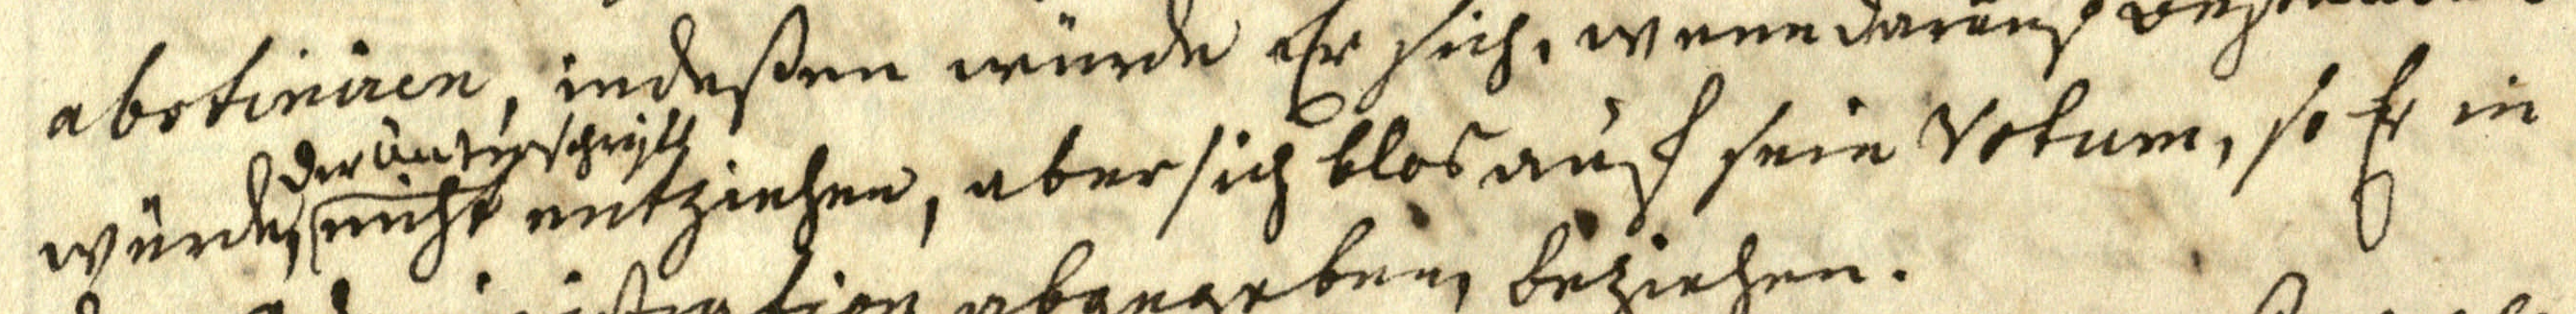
würde der Unterschrift nicht entziehen, aber sich blos auf sein Votum, so Er in
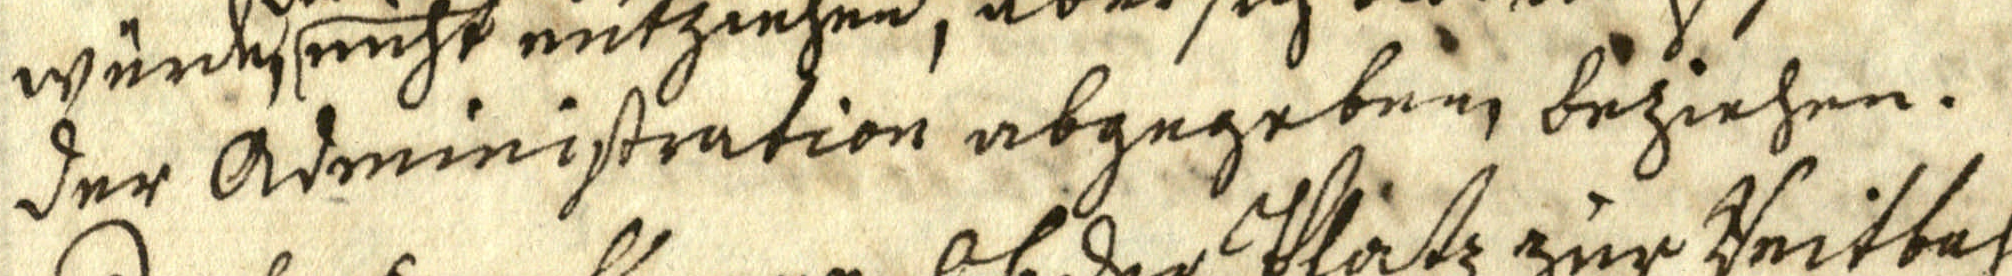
der Administration abgegeben, beziehen.
